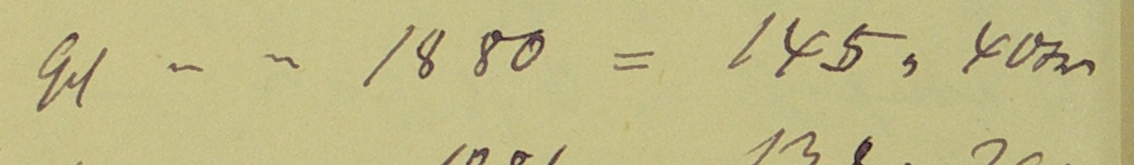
9.) * 1880 = 145 * 40 *
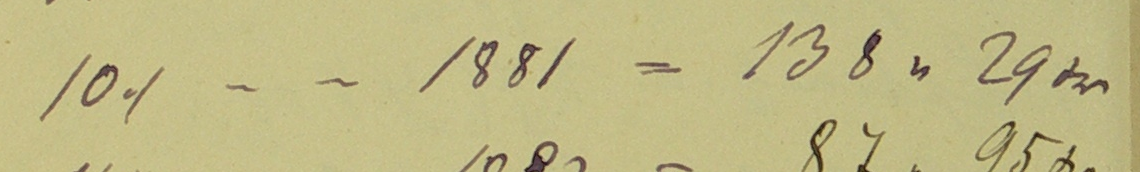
10.) * 1881 = 138 * 29 *
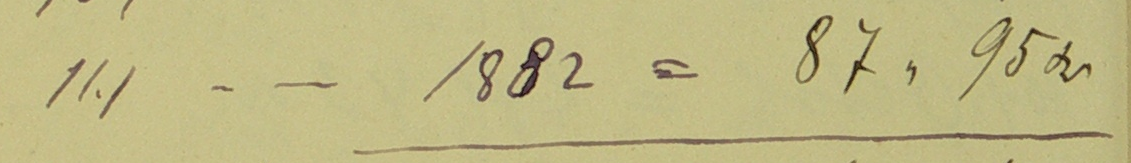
11.) * 1882 = 87 * 95 *
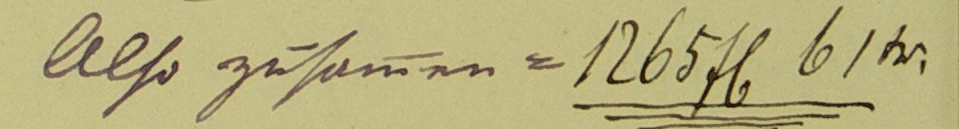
Also zusammen = 1265 * 61 *
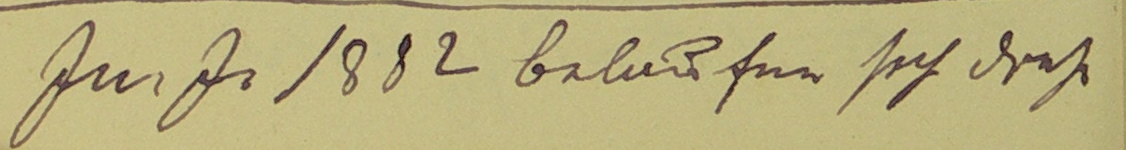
Im Jahre 1882 belaufen sich diese…
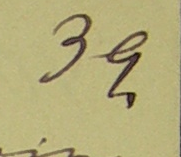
39
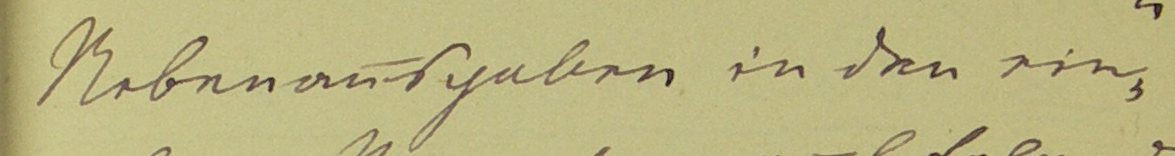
…Nebenausgaben in den ein
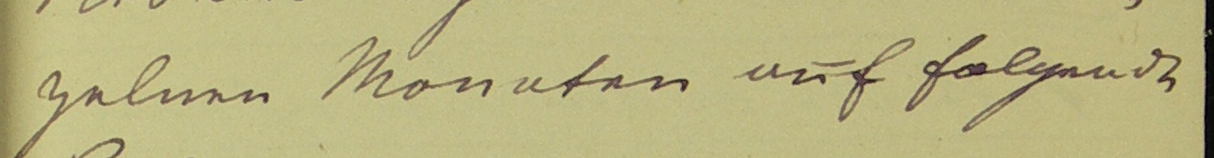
zelnen Monaten auf folgende
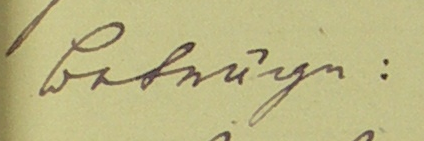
Beträge:
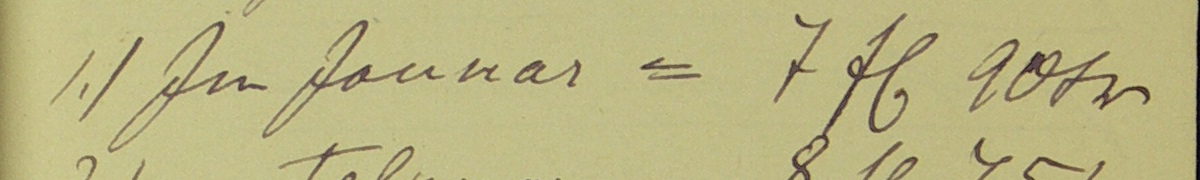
1.) Im Januar = 7 fl 90 tw
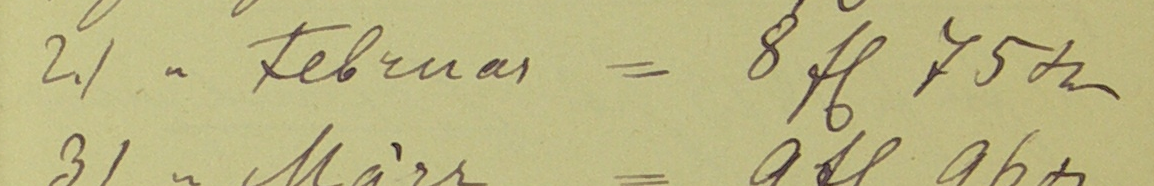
2.) * Februar = 8 * 75 *
